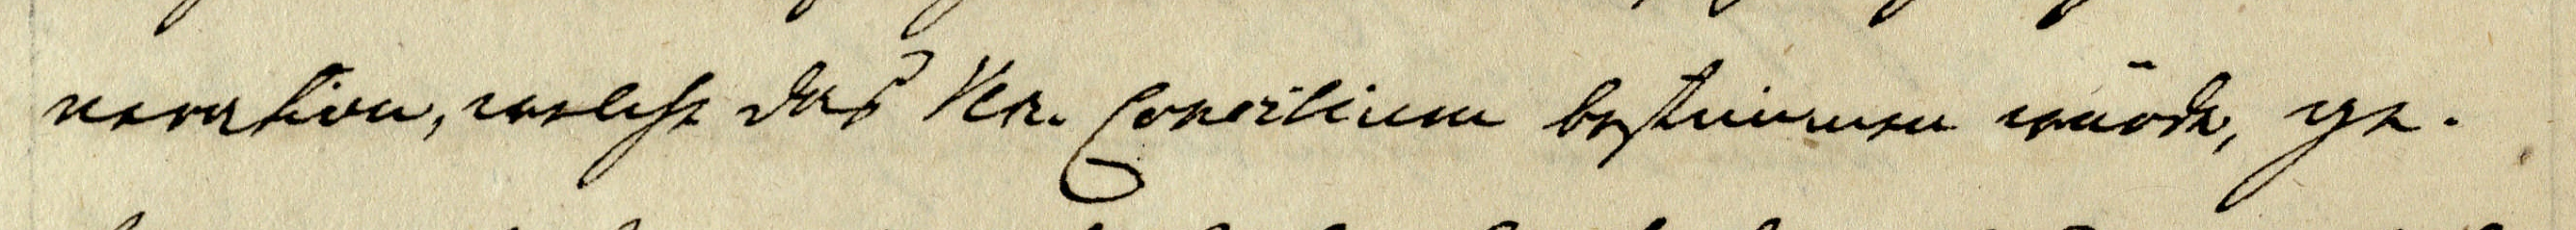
neration, welche das Ven. Concilium bestimmen würde, ge¬
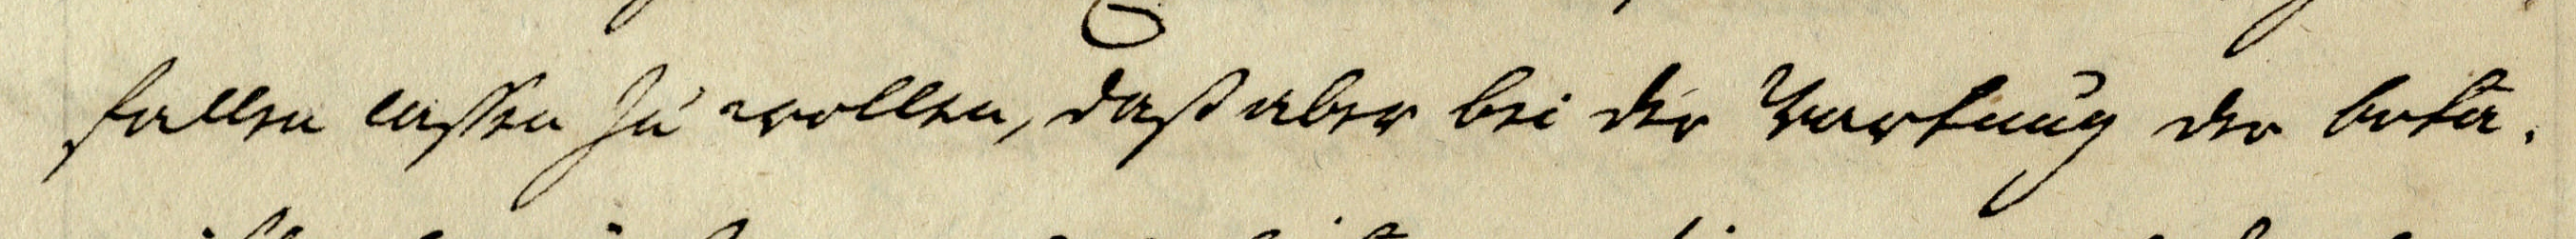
fallen lassen zu wollen, daß aber bei der Wartung der bota¬
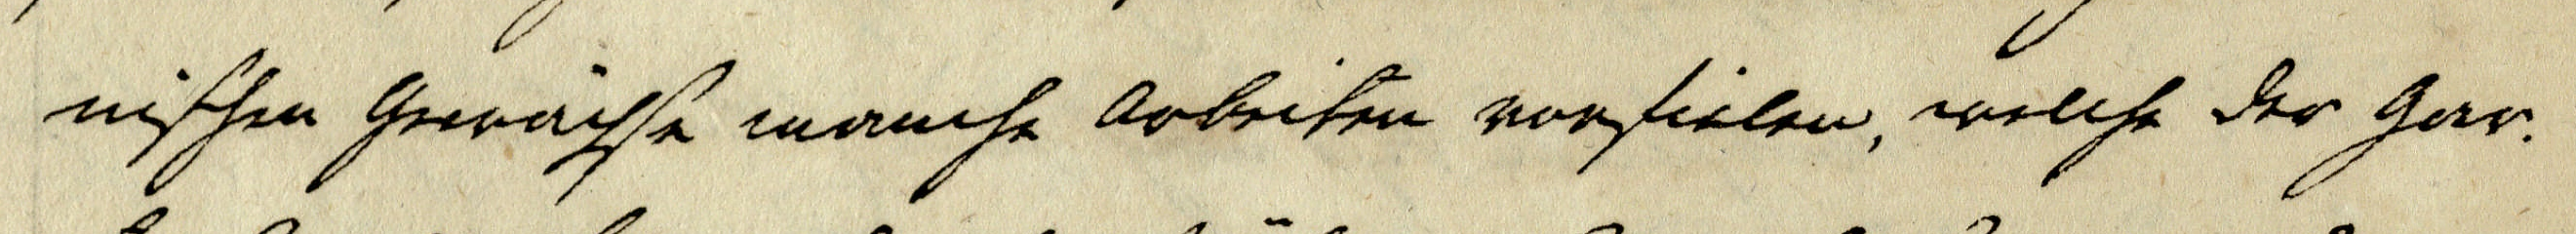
nischen Gewächse manche Arbeiten vorfielen, welche der Gar¬
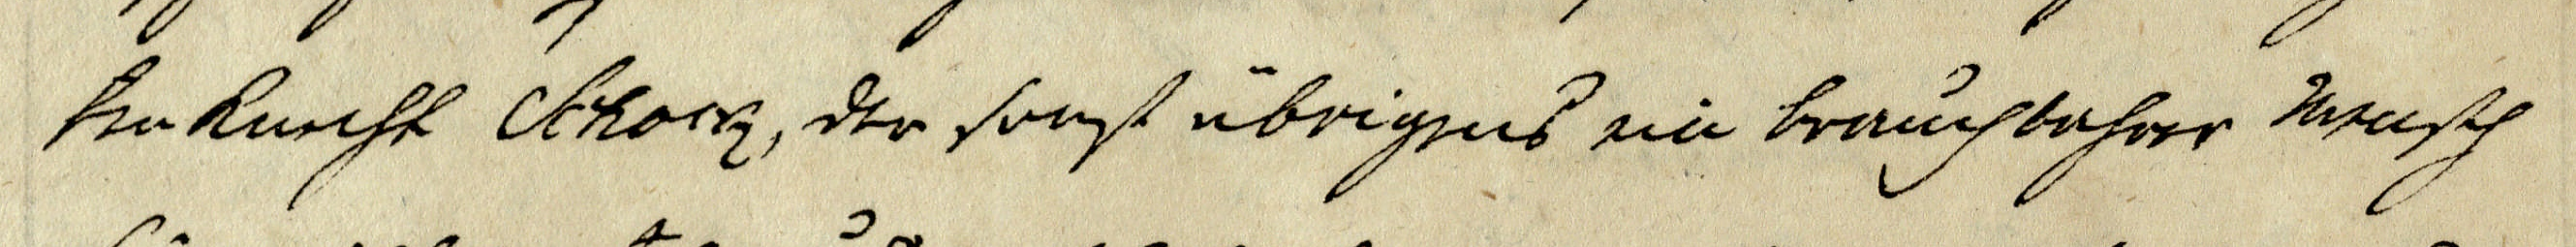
tenknecht Schock, der sonst übrigens ein brauchbahrer Mensch
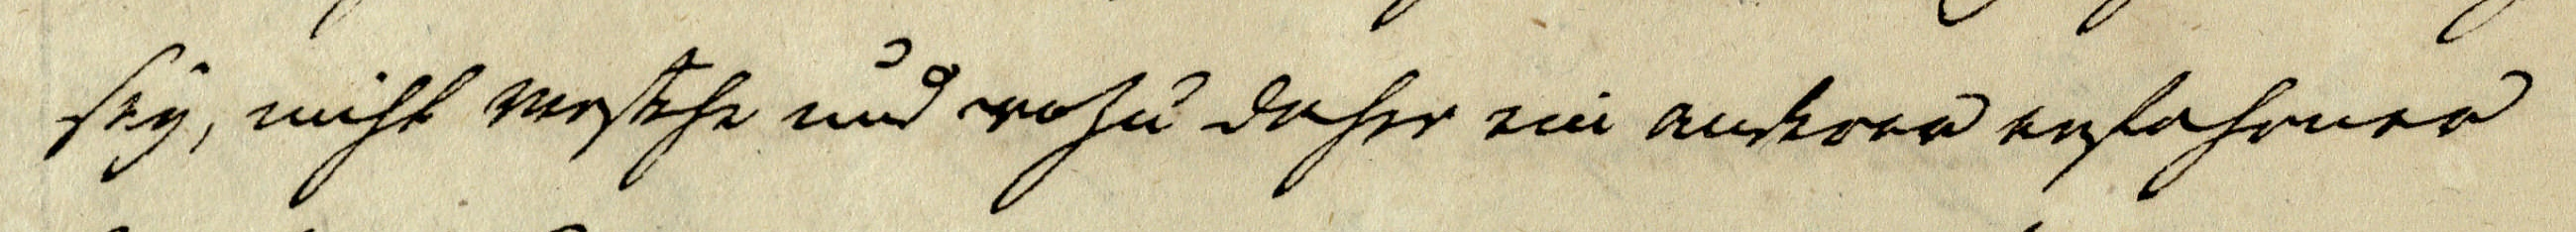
seÿ, nicht verstehe und wozu daher ein anderer erfahrner
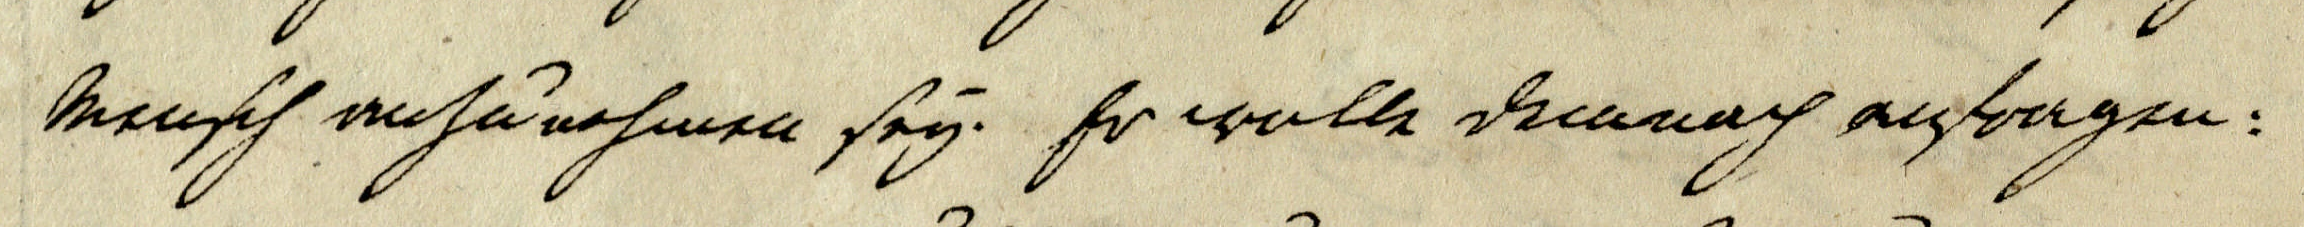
Mensch anzunehmen seÿ. Er wolle demnach anfragen:
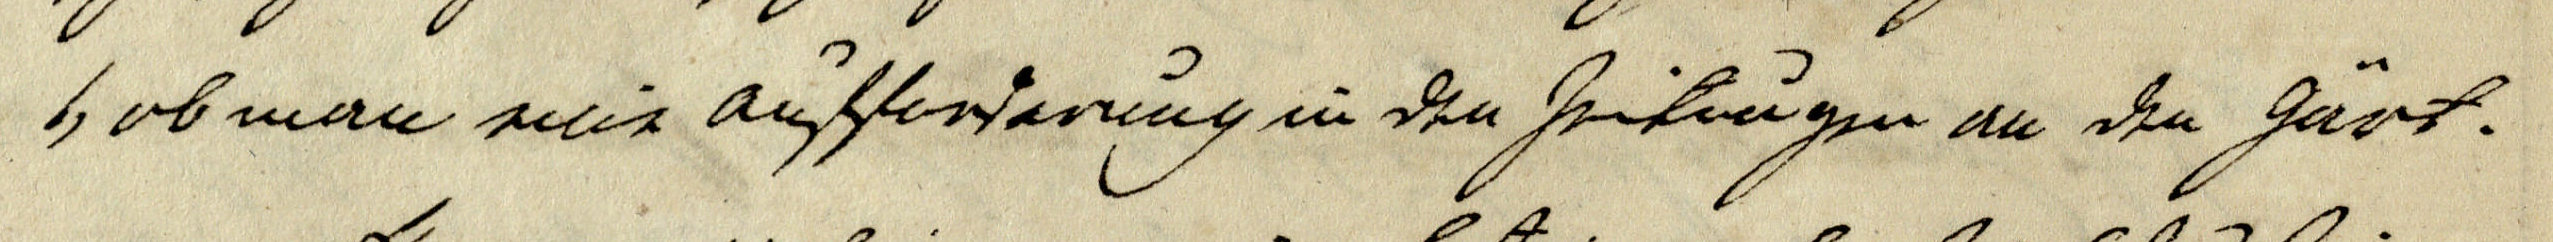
1, ob man eine Aufforderung in den Zeitungen an den Gärt¬
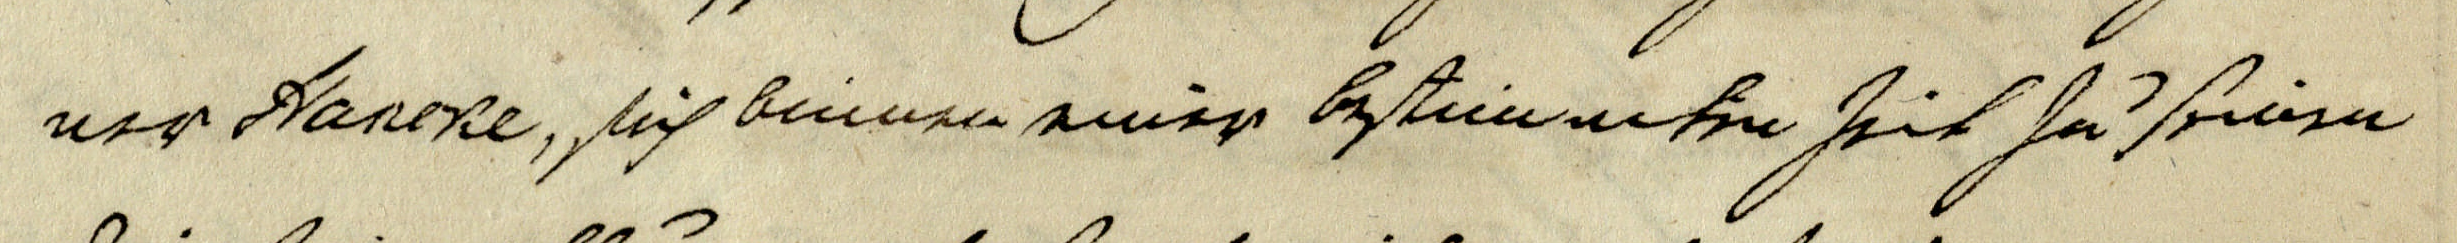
ner Hancke, sich binnen einer bestimmten Zeit zu seinen
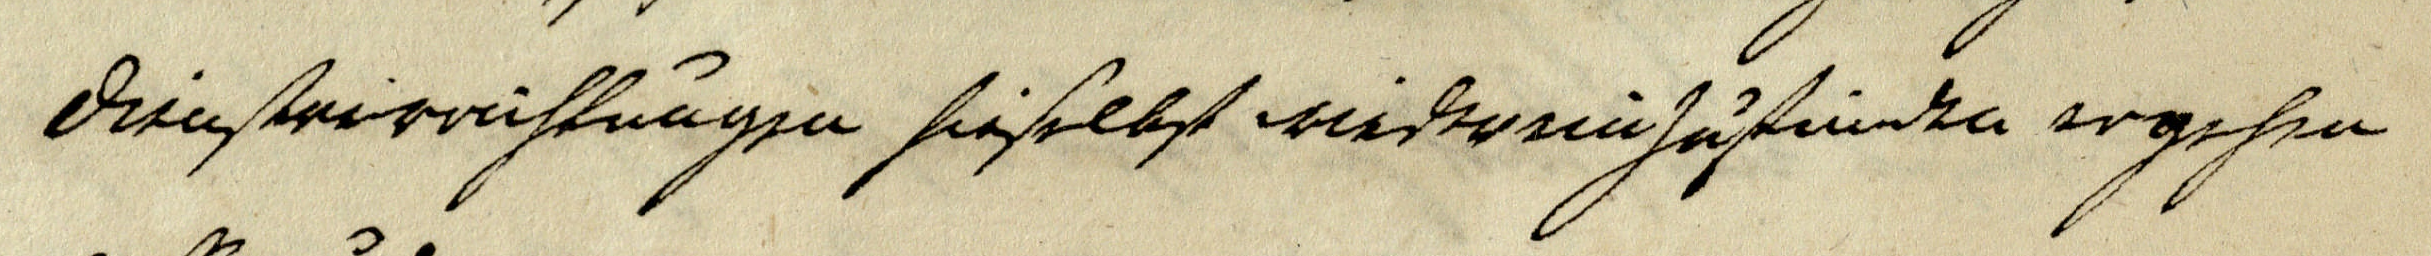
Dienstverrichtungen hieselbst wiedereinzufinden ergehen
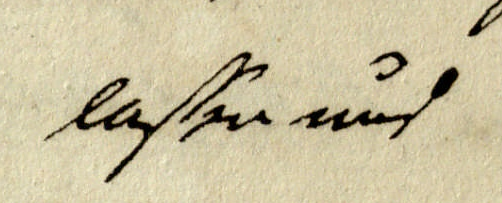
lassen und
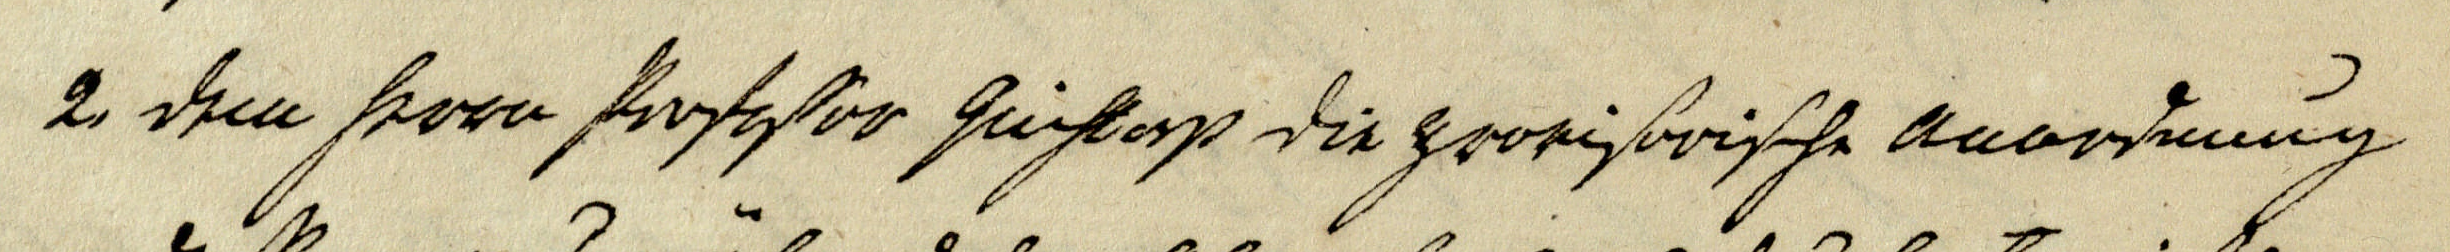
2. dem Herrn Professor Quistorp die provisorische Anordnung
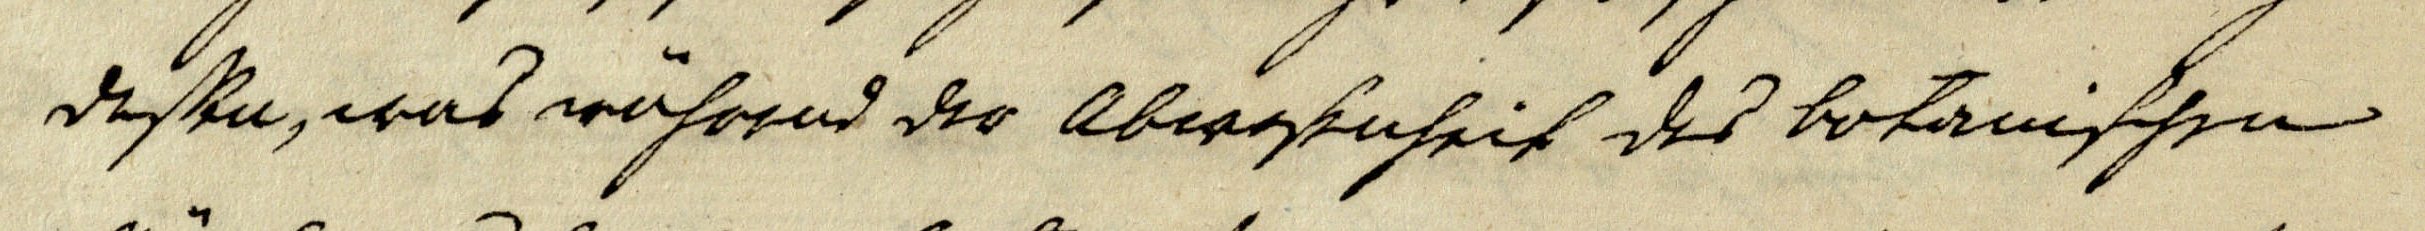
dessen, was während der Abwesenheit des botanischen
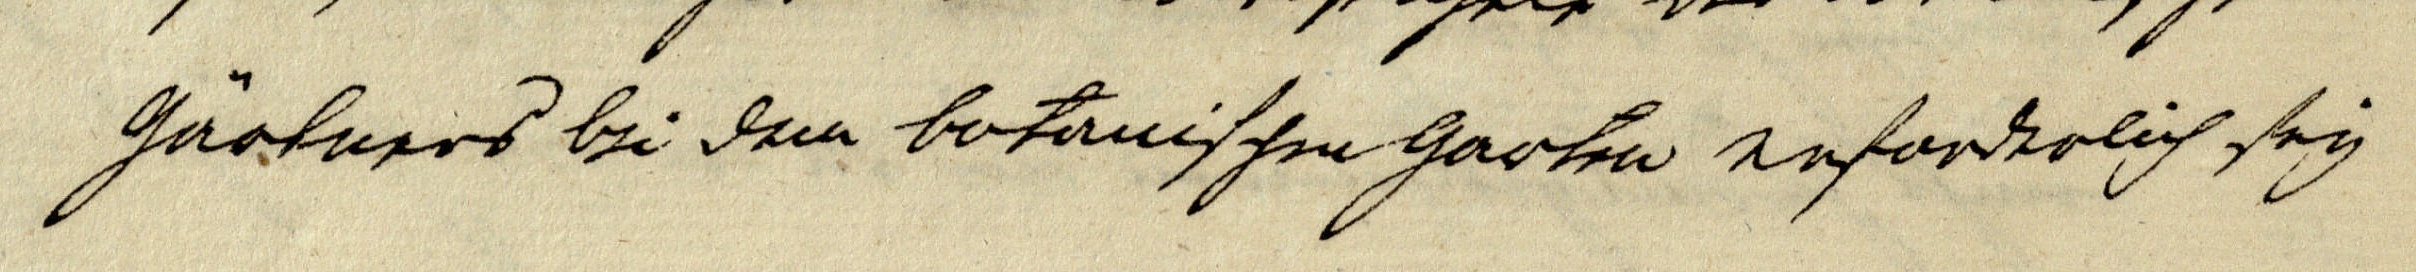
Gärtners bei dem botanischen Garten erforderlich seÿ
